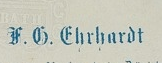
F. G. Ehrhardt
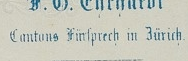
Cantons Fürsprech in Zürich.
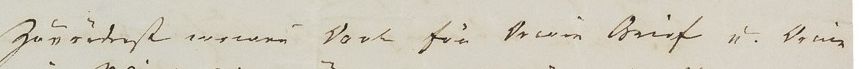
Zuvörderst meinen Dank für Deinen Briefu. Deine
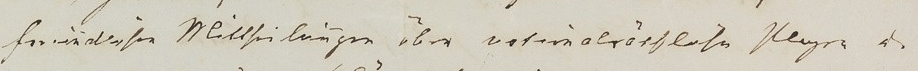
freundlichen Mittheilungen über nationalräthliche Plagen u.
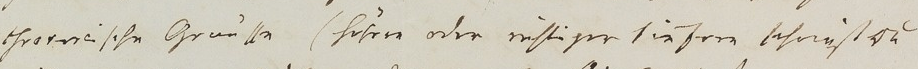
theoretische Genüsse (höhere oder richtiger tiefere scheinst Du
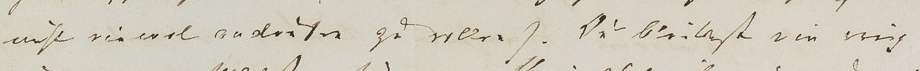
nicht einmal andeuten zu wollen). Du bietest ein ewig
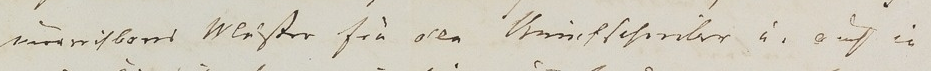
unerreichbares Muster für alle Briefschreiber u. auch in
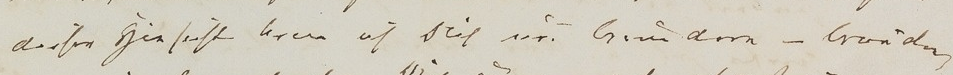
dieser Hinsicht kann ich Dich nur bewundern – bewundern,
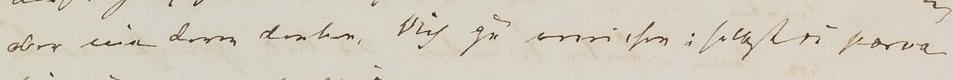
aber nie daran denken, Dich zu erreichen: selbst si parva
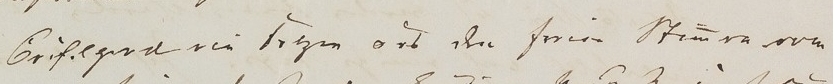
Beifolgend ein Fetzen aus den freien Stimmen vom
